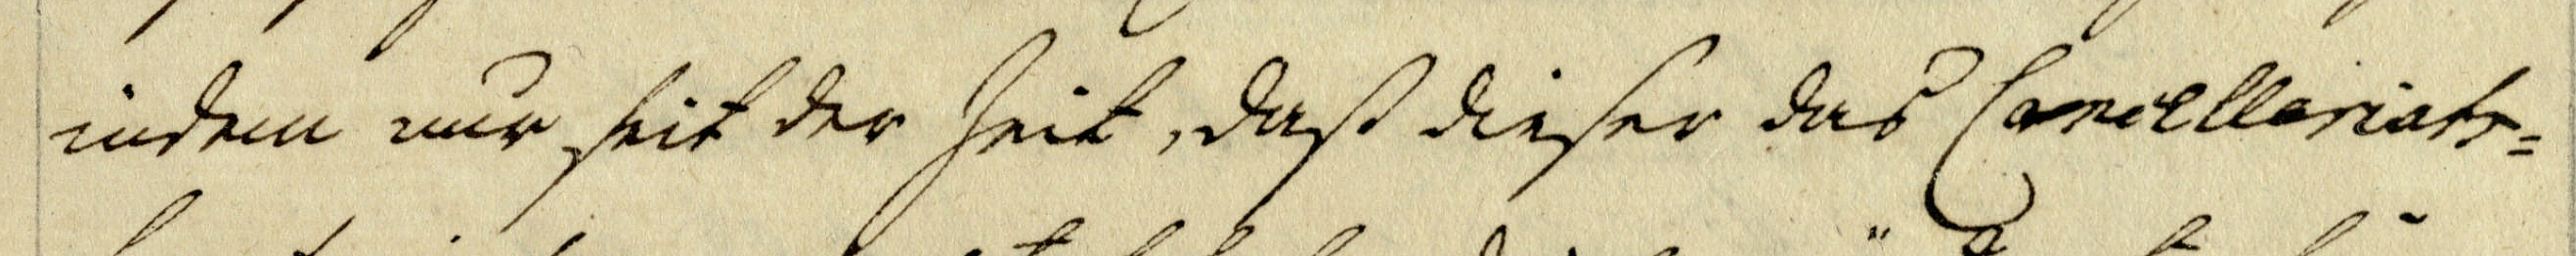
indem nur seit der Zeit, daß dieser das Cancelleriats
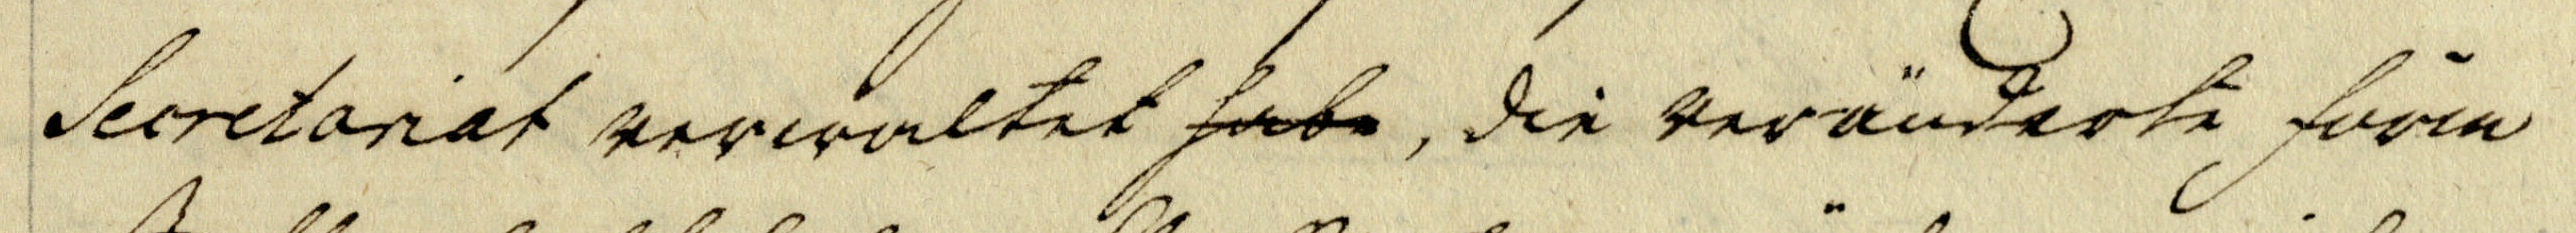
Secretariat verwaltet habe, die veränderte Form
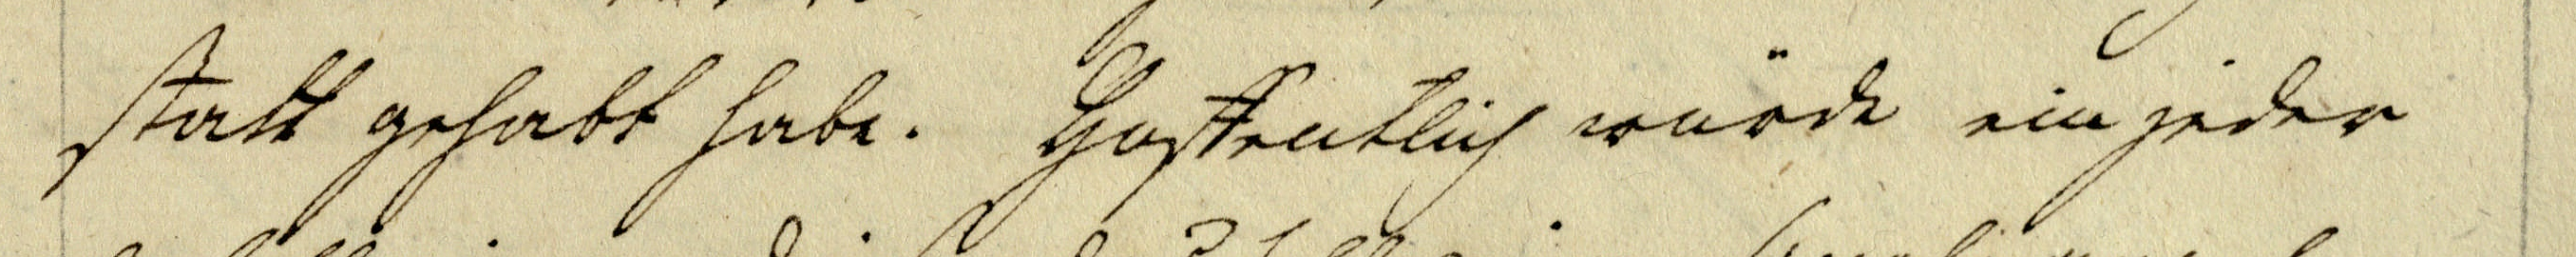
statt gehabt habe. Hoffentlich würde ein jeder
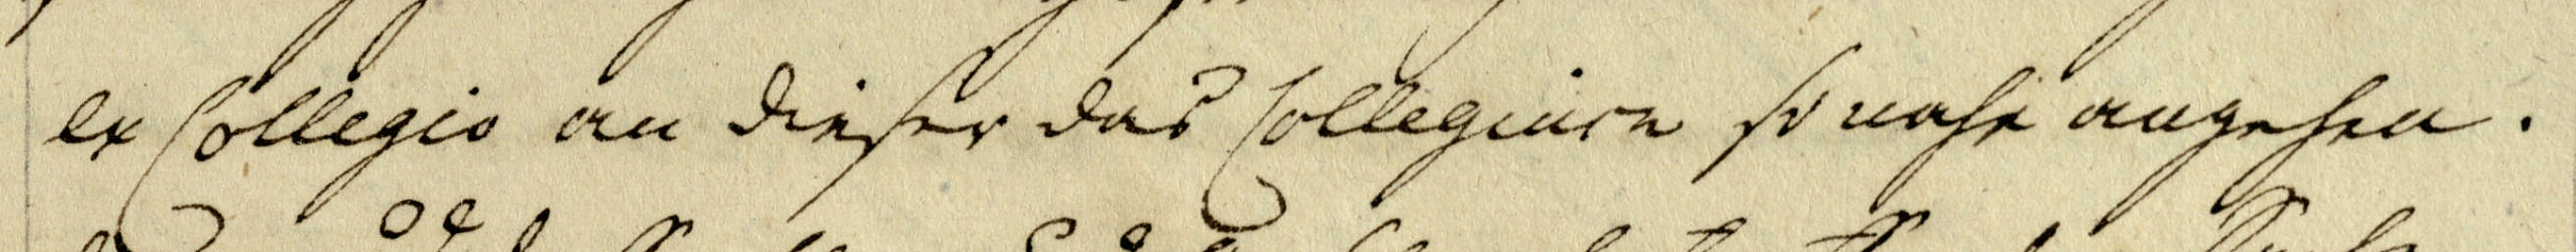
ex Collegio an dieser das Collegium so nahe angehen¬
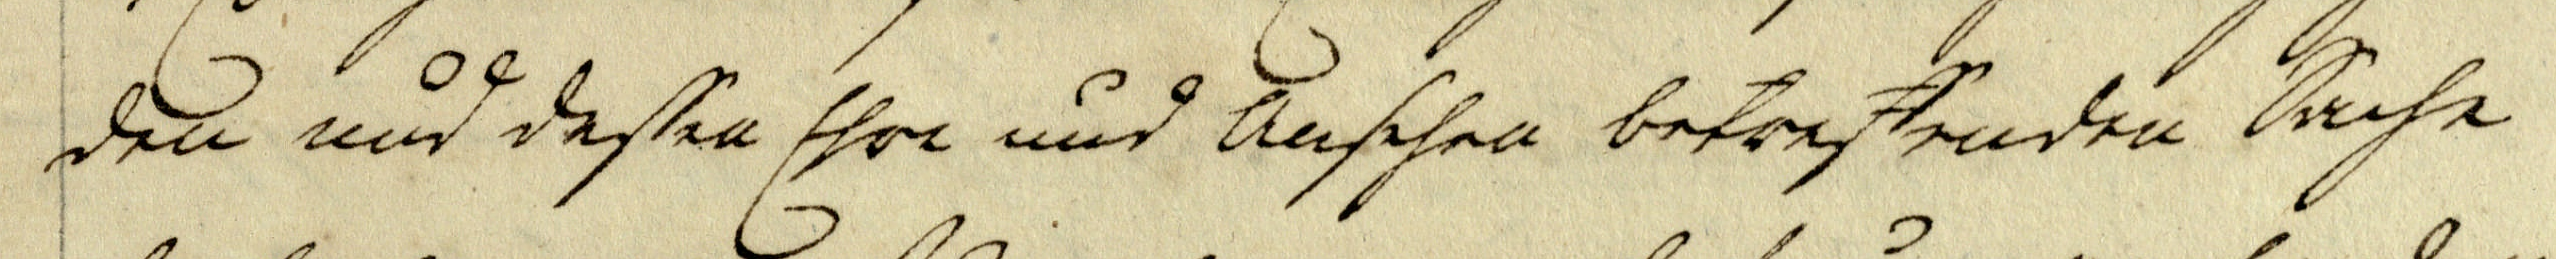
den und dessen Ehre und Ansehen betreffenden Sache
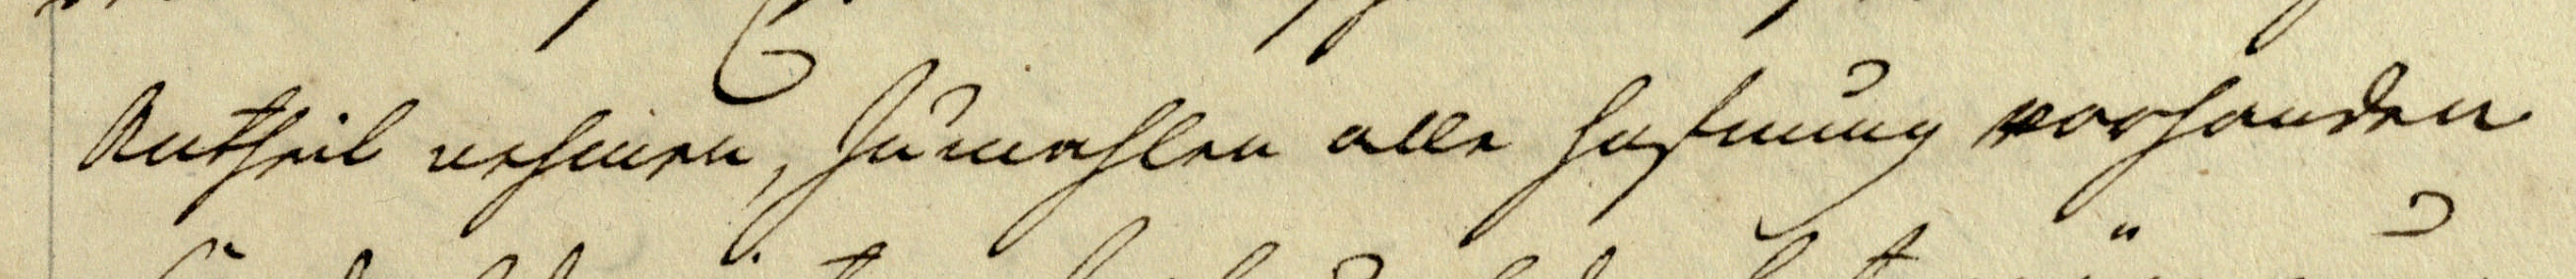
Antheil nehmen, zumahlen alle Hofnung vorhanden
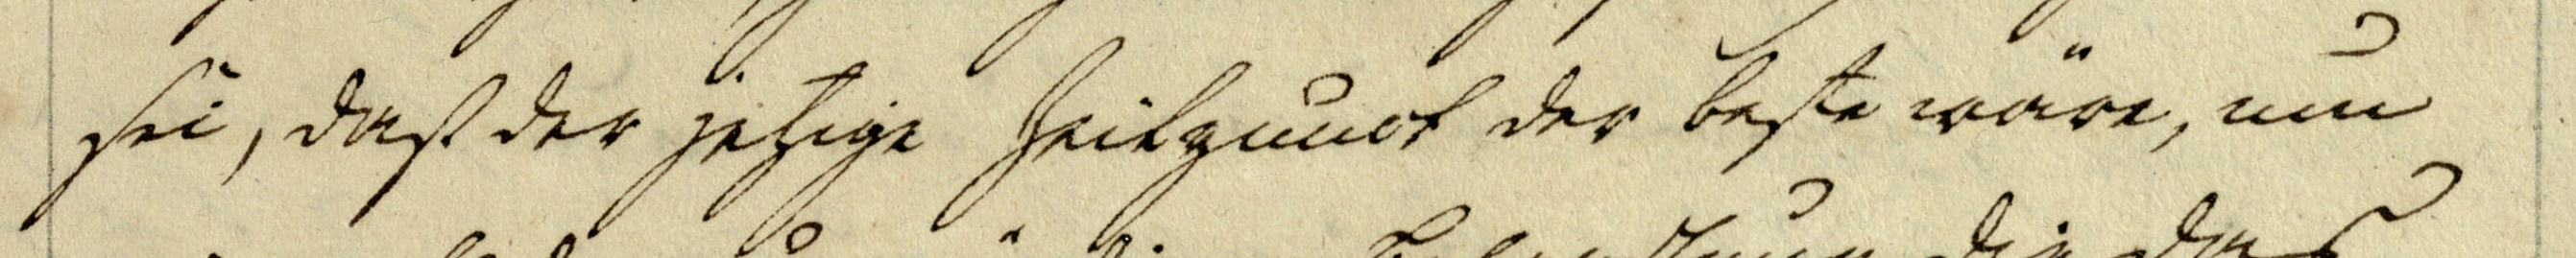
sei, daß der jetzige Zeitpunct der beste wäre, um
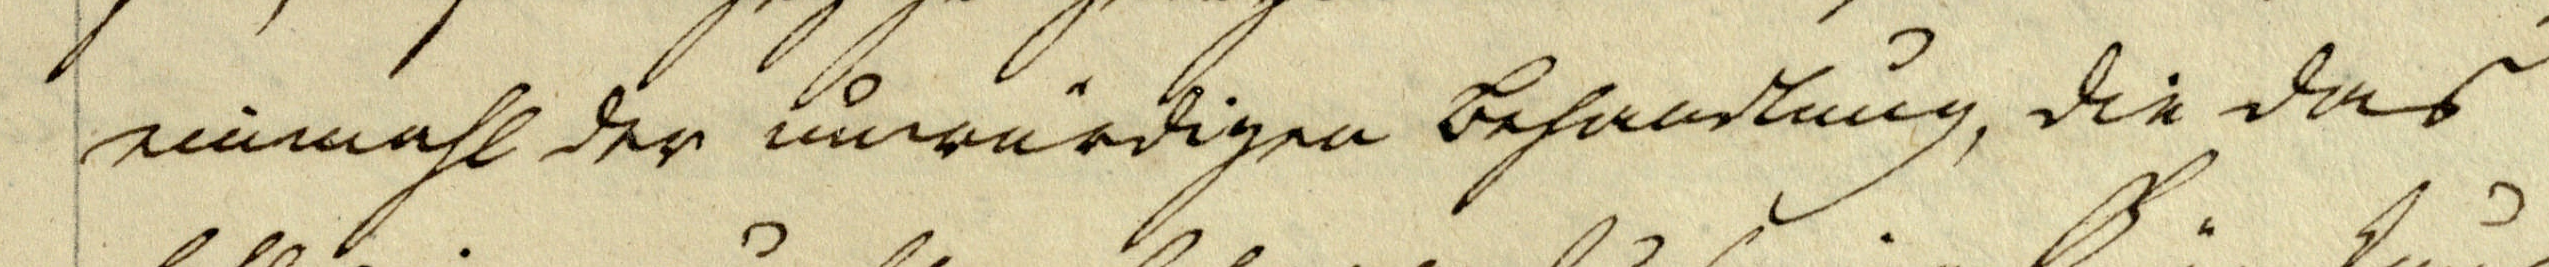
einmahl der unwürdigen Behandlung, die das
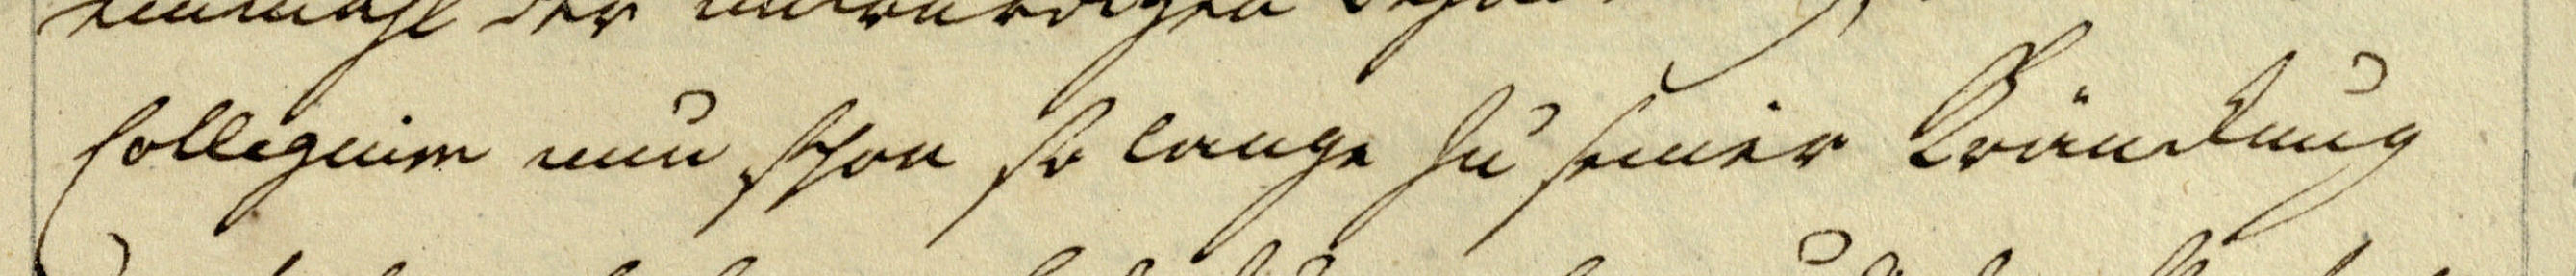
Collegium nun schon so lange zu seiner Kränckung
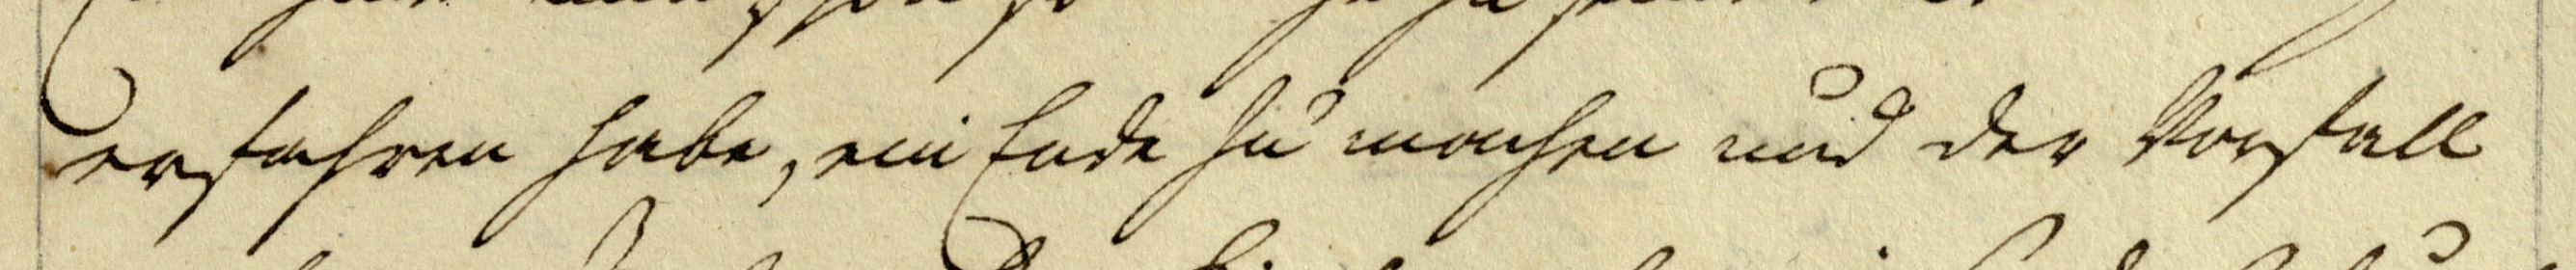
erfahren habe, ein Ende zu machen und der Vorfall
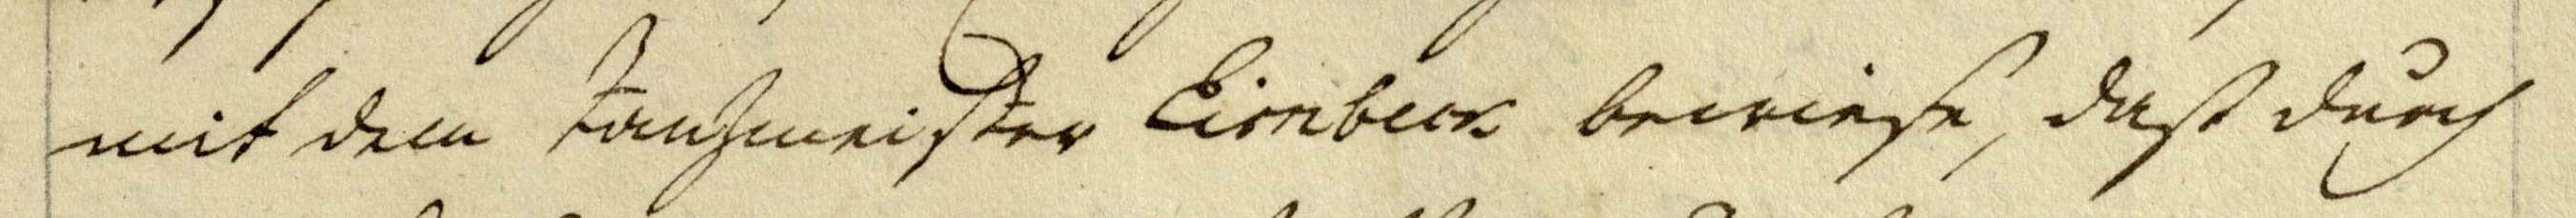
mit dem Tanzmeister Eimbeck bewiese, daß durch
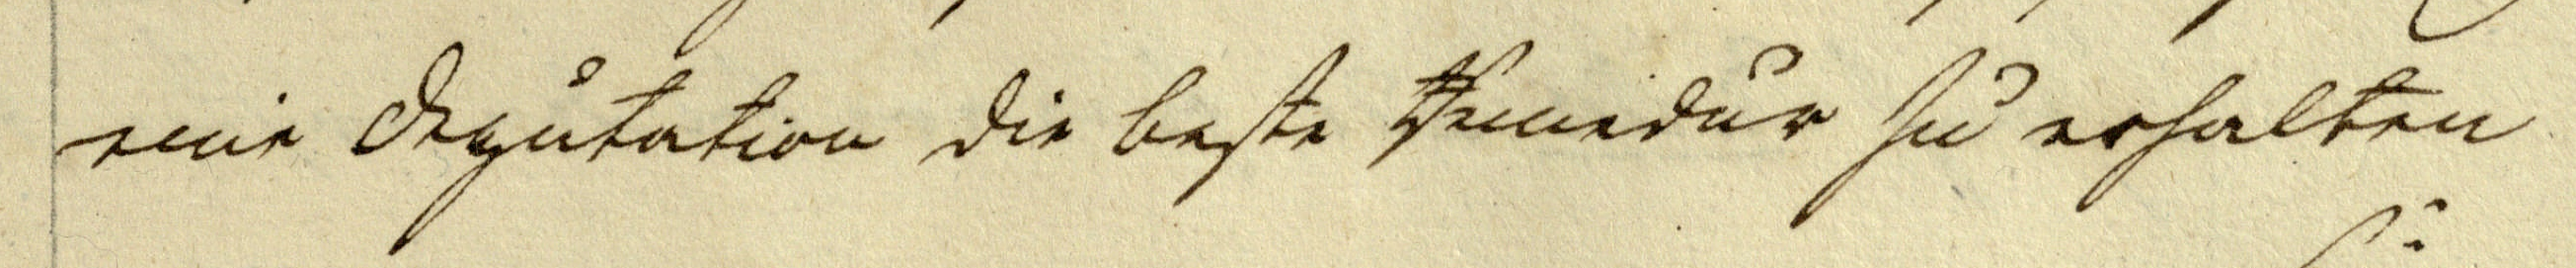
eine Deputation die beste Remedur zu erhalten
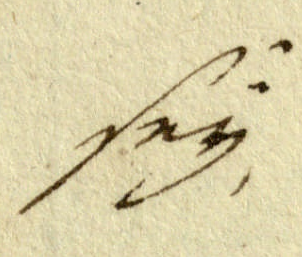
seÿ.
